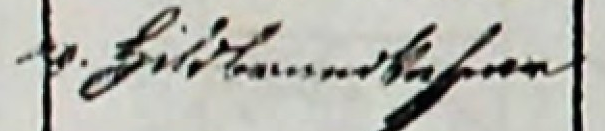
v. Hildbrandkafner
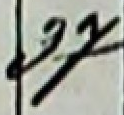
37
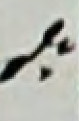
do
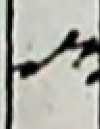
do
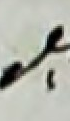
do
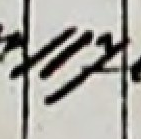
117
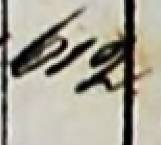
612
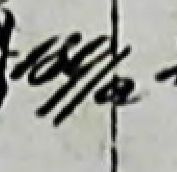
189/a
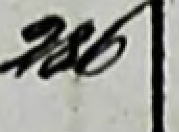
286
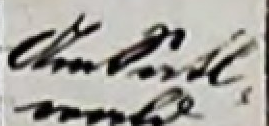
Am Satl„
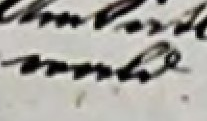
wald
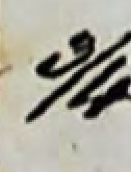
3/4
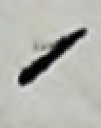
1
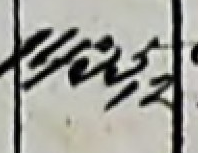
1435,2
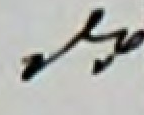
do
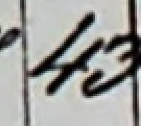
43
